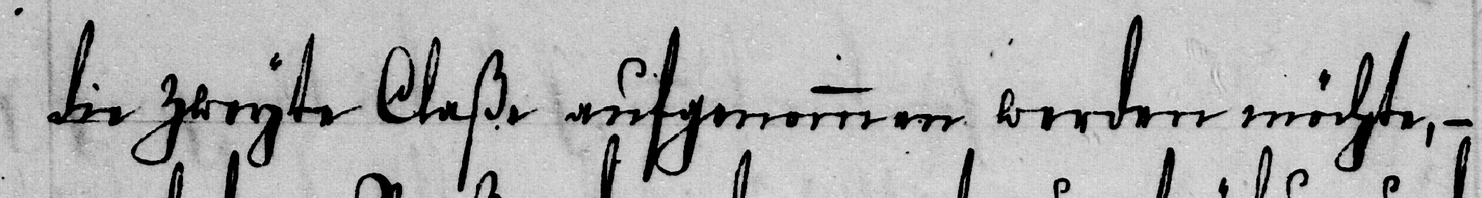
die zweyte Claße aufgenommen werden möchte, –
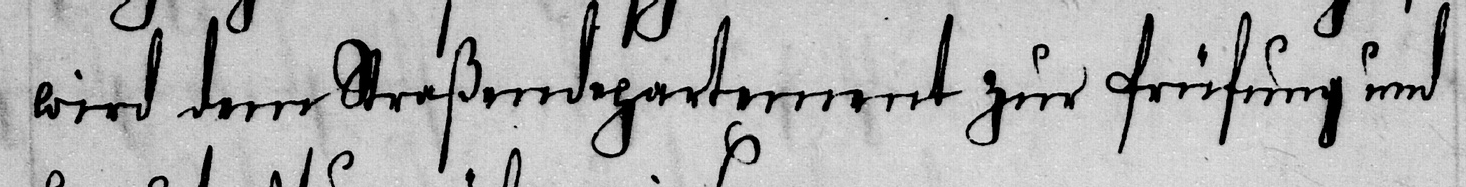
wird dem Straßendepartement zur Prüfung und
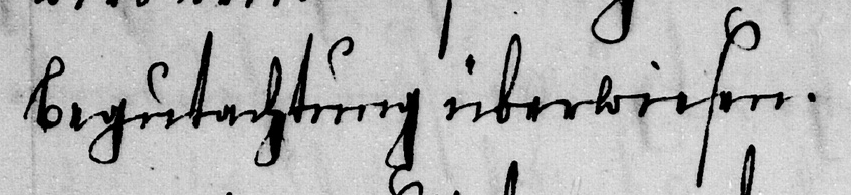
Begutachtung überwiesen.
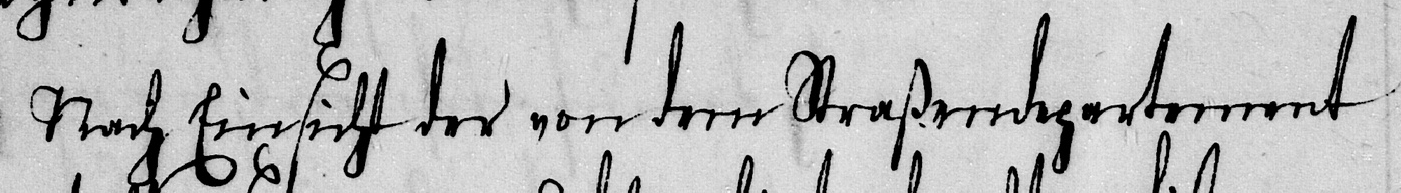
Nach Einsicht der von dem Straßendepartement
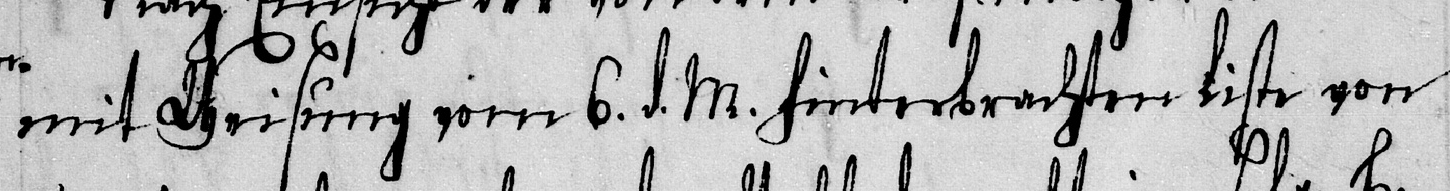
mit Weisung vom 6. d. M. hinterbrachten Liste von
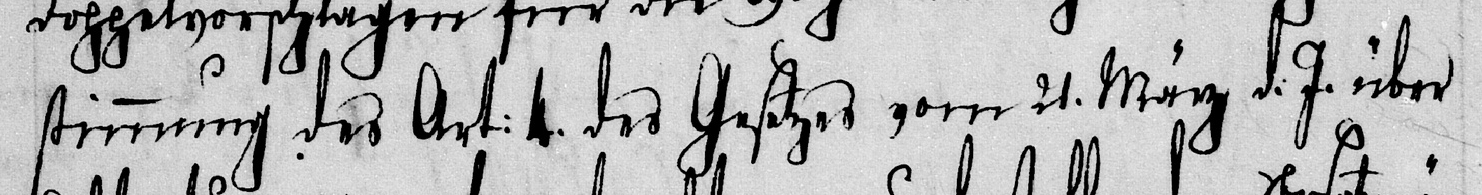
stimmung des Art: 4. des Gesetzes vom 21. März d. J. über
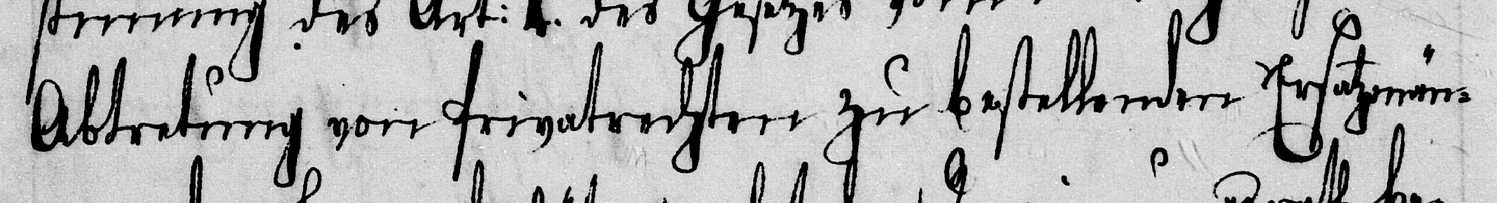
Abtretung von Privatrechten zu bestellenden Ersatzmän¬
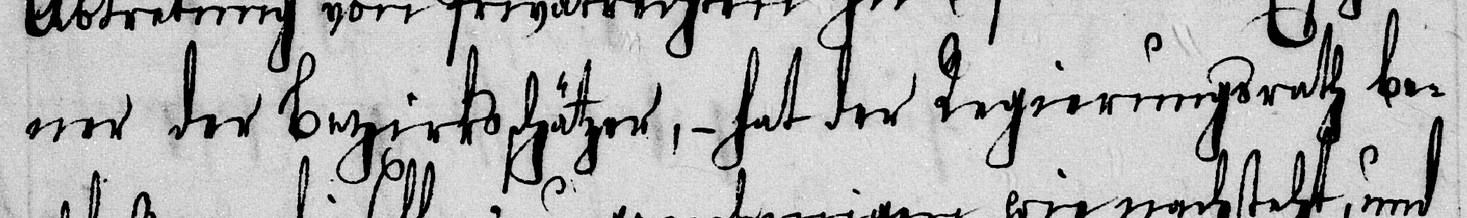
ner der Bezirksschätzer, – hat der Regierungsrath be¬
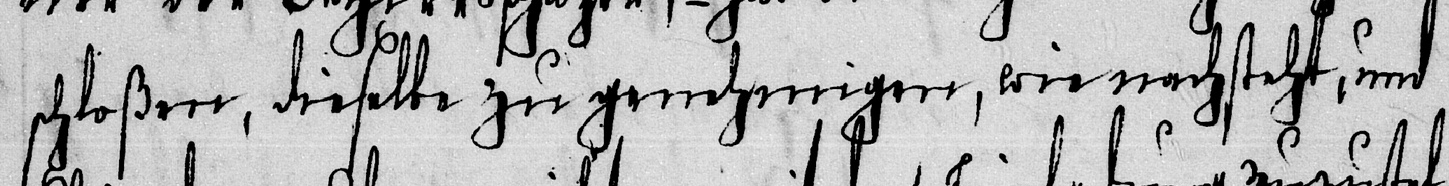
schloßen, dieselbe zu genehmigen, wie nachsteht, und
